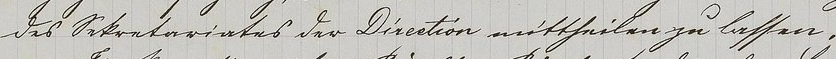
des Sekretariates der Direction mittheilen zu lassen. –
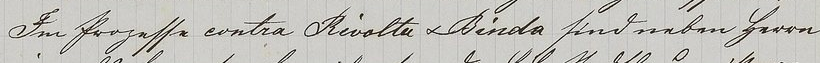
Im Prozesse contra Rivolta & Binda sind neben Herrn
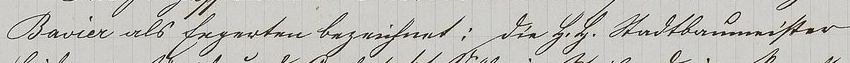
Bavier als Experten bezeichnet: die H.H. Stadtbaumeister
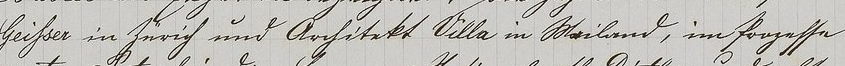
Geisser in Zürich und Architekt Villa in Mailand, im Prozesse
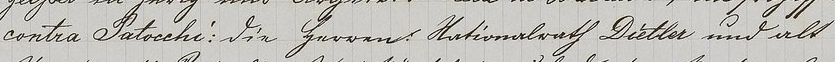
contra Patocchi : die Herren Nationalrath Dietler und alt
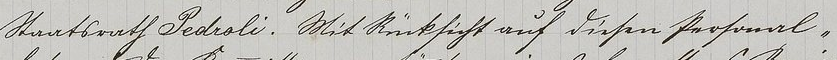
Staatsrath Pedroli. Mit Rücksicht auf diesen Personal-
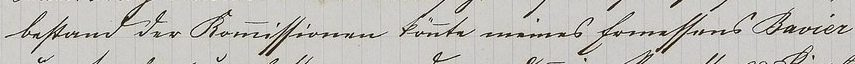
bestand der Kommissionen könnte meines Ermessens Bavier
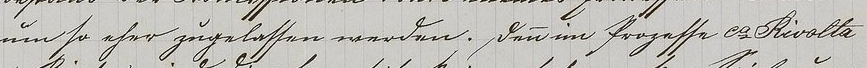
um so eher zugelassen werden. Denn im Prozesse caRivolta
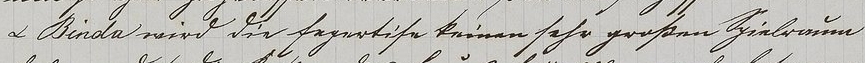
& Binda wird die Expertise keinen sehr großen Spielraum
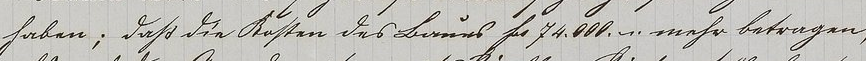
haben; daß die Kosten des Baues frs 74.000.–. mehr betragen,
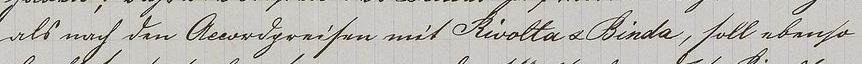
als nach den Accordpreisen mit Rivolta & Binda, soll ebenso
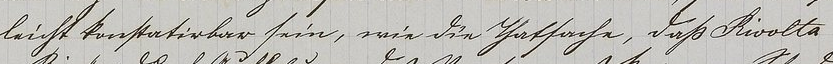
leicht konstatirbar sein, wie die Thatsache, daß Rivolta
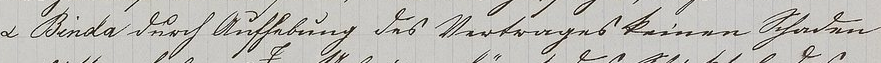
& Binda durch Aufhebung des Vertrages keinen Schaden
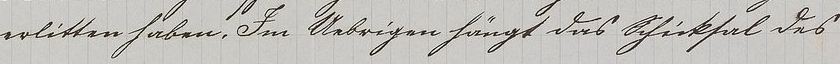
erlitten haben. Im Uebrigen hängt das Schicksal des
